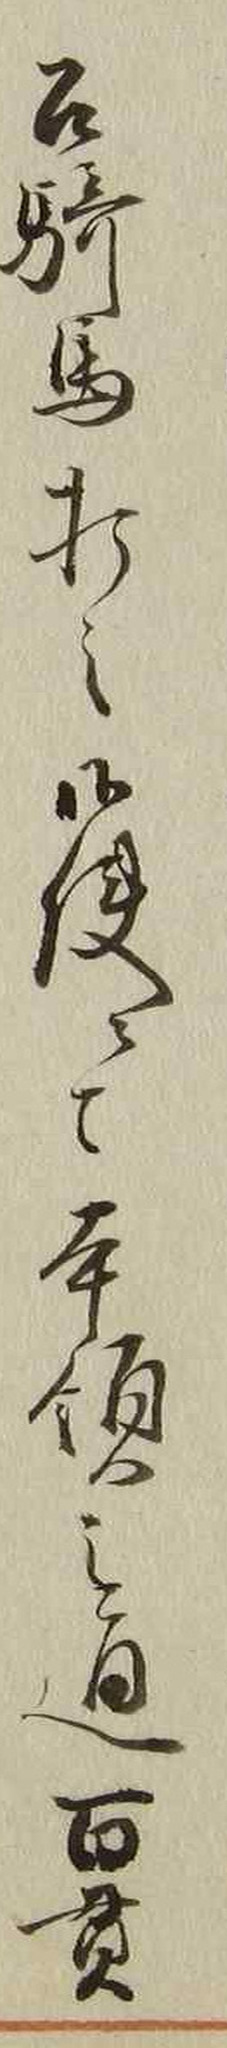召騎馬打之御使ニて本領之通百貫
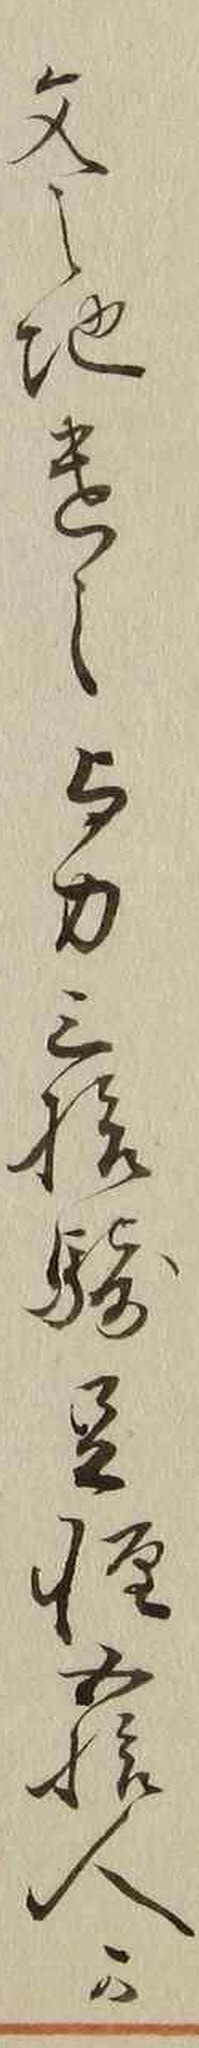文之地遣之与力三拾騎足軽五拾人可
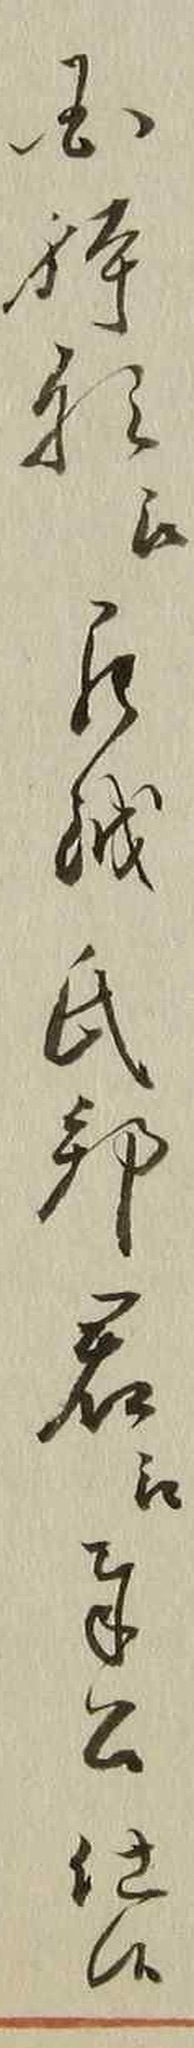国鉢形江罷越氏邦君江奉公仕候
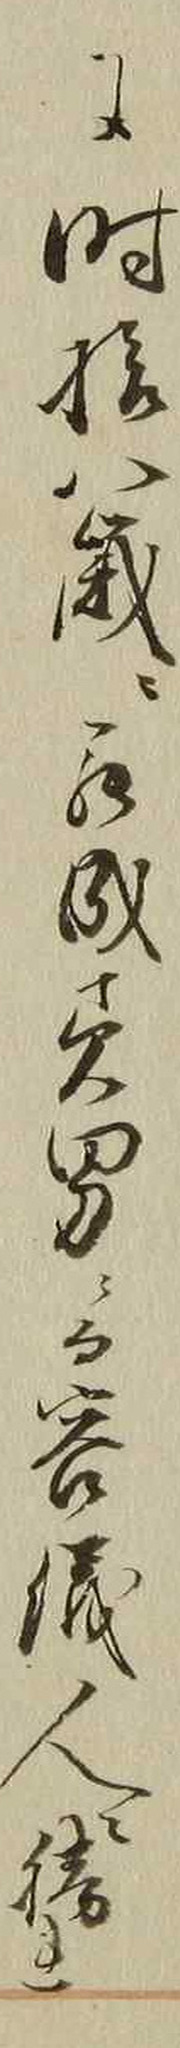爾時拾八歳ニ罷成美男ニ而容儀人ニ勝れ
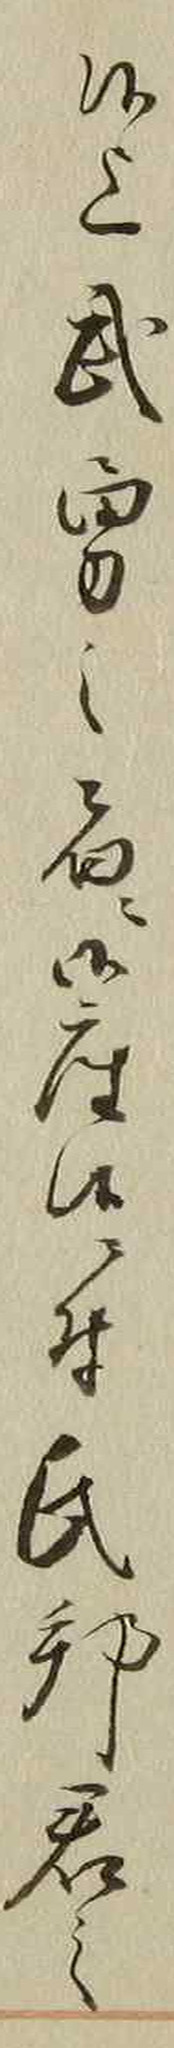候上武勇之者ニ御座候ニ付氏邦君之
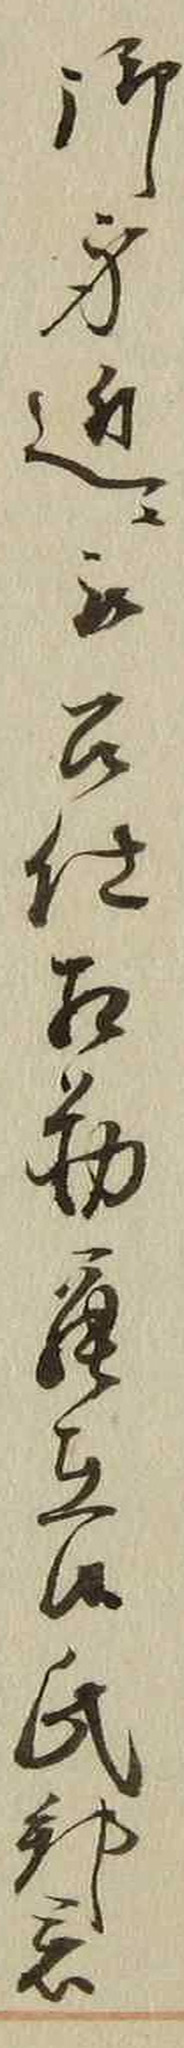御身近ニ被召仕相勤罷在候氏邦君
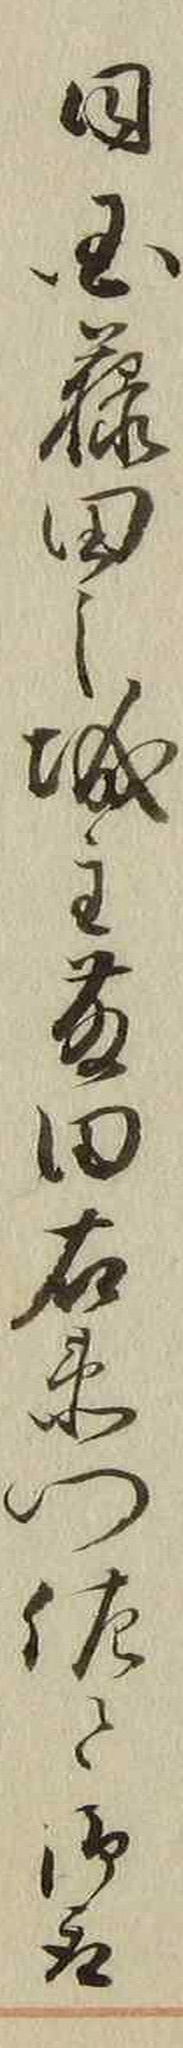同国藤田之城主藤田右衛門佐と御取
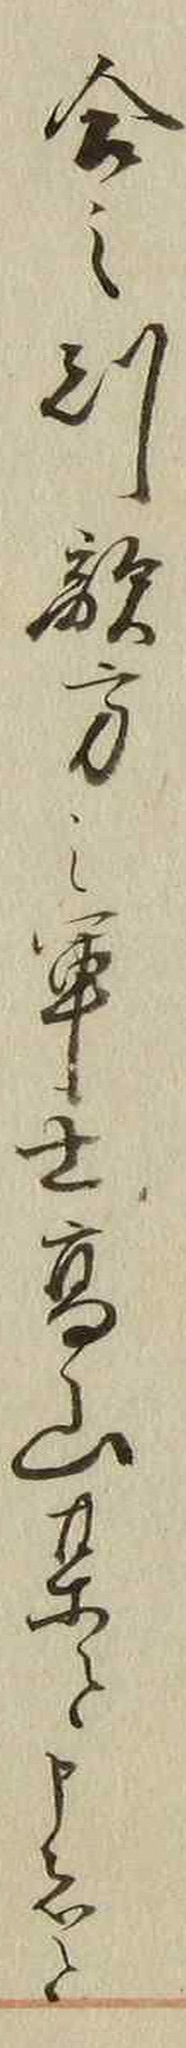合之刻敵方之軍士高山某と申者と
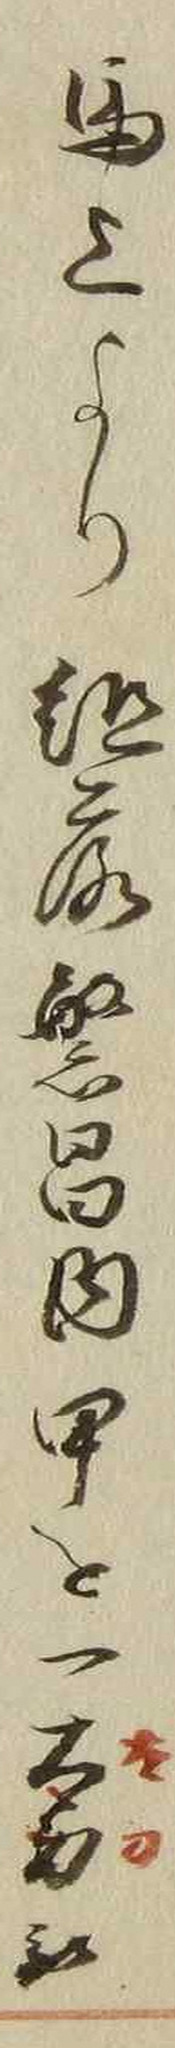馬上より組落繁昌内甲を一大刀被
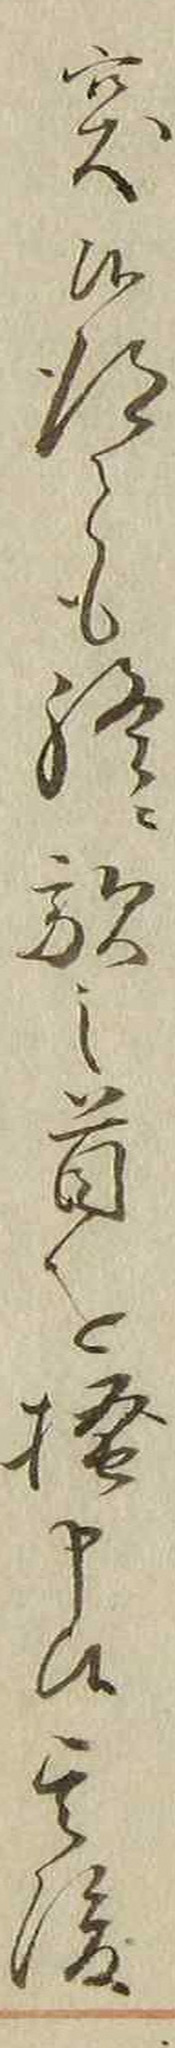突候得とも終ニ敵之首を掻申候其後
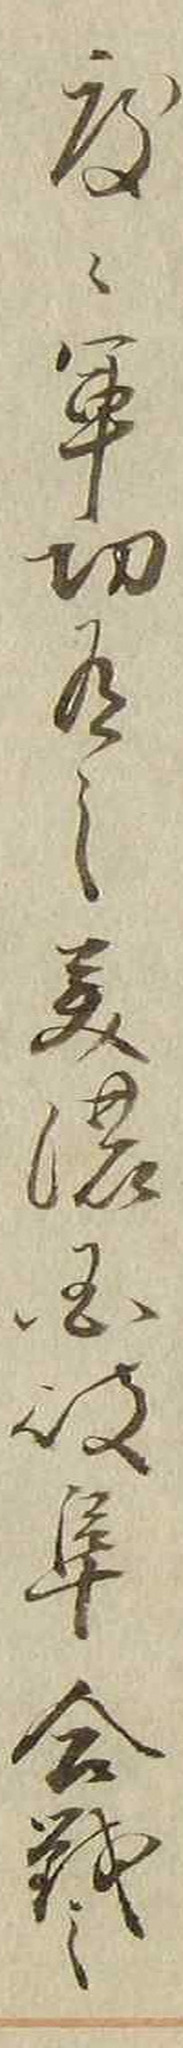度々軍功有之美濃国岐阜合戦之
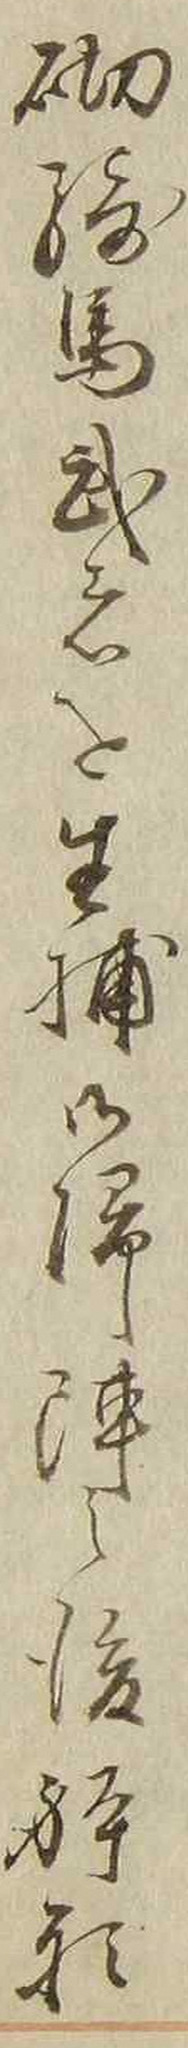砌騎馬武者を生捕御帰陣之後鉢形
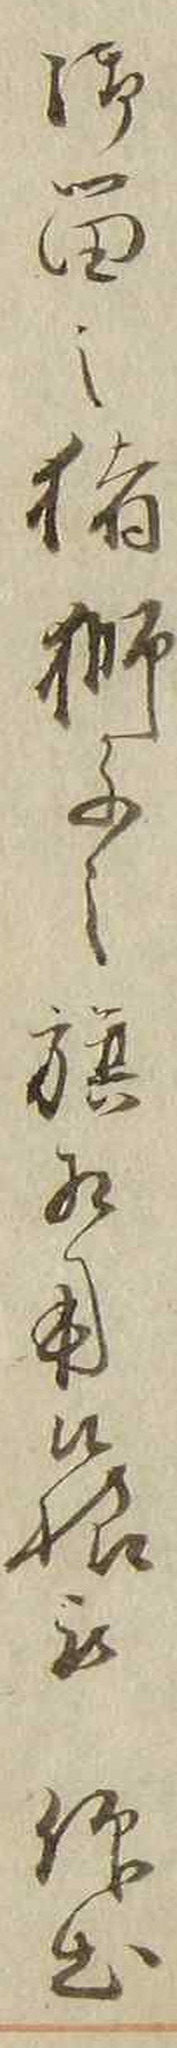御留之猪獅子之旗相用候様被仰出

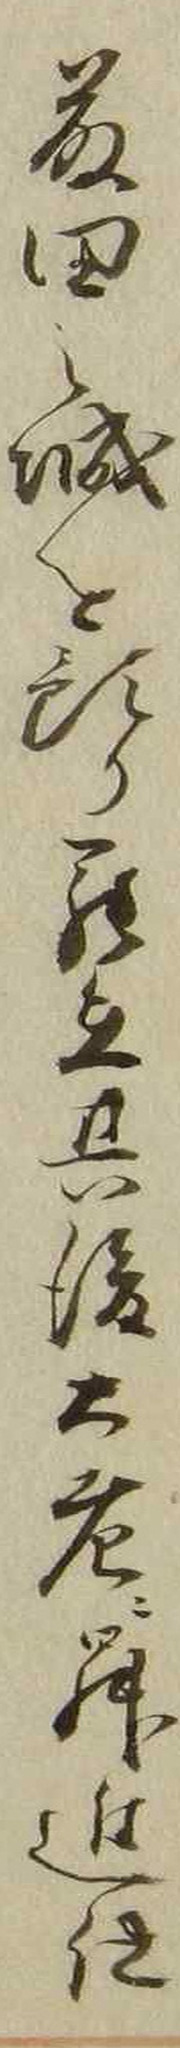藤田之城を預り罷在其後大老ニ昇進仕
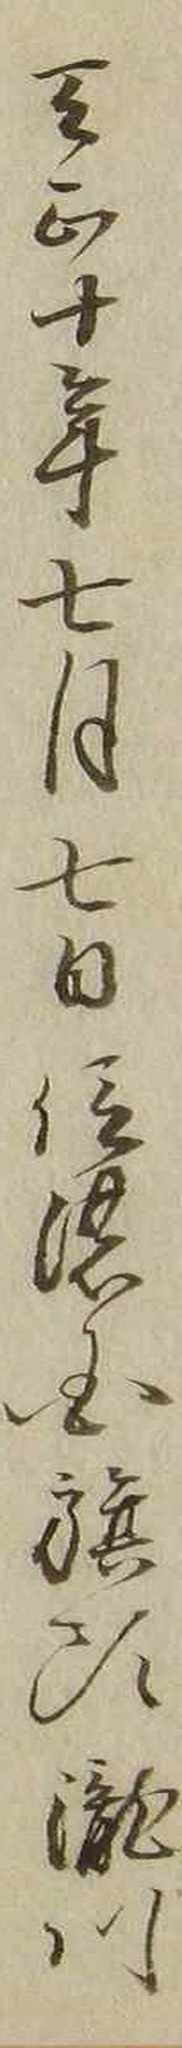天正十年七月七日信濃国旗頭滝川
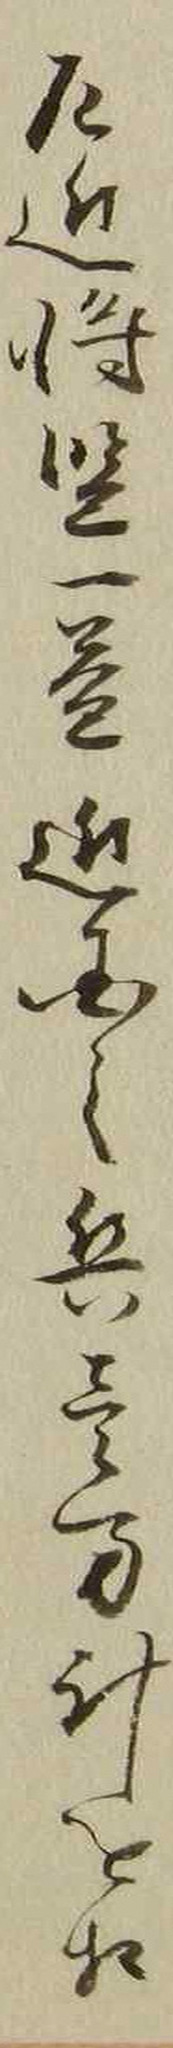左近将監一益近国之兵壱万計を相
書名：諸士系譜　巻之122　よ之部5
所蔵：会津若松市立会津図書館
